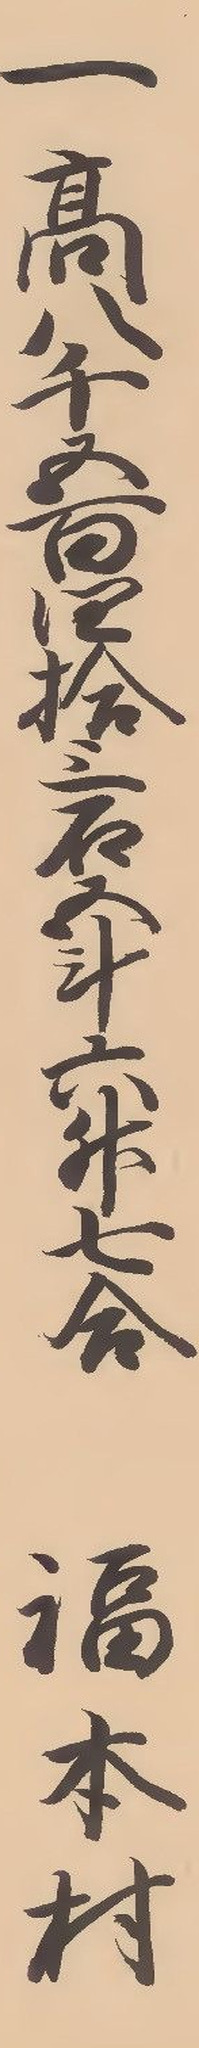一高八千五百四拾三石五斗六升七合福本村
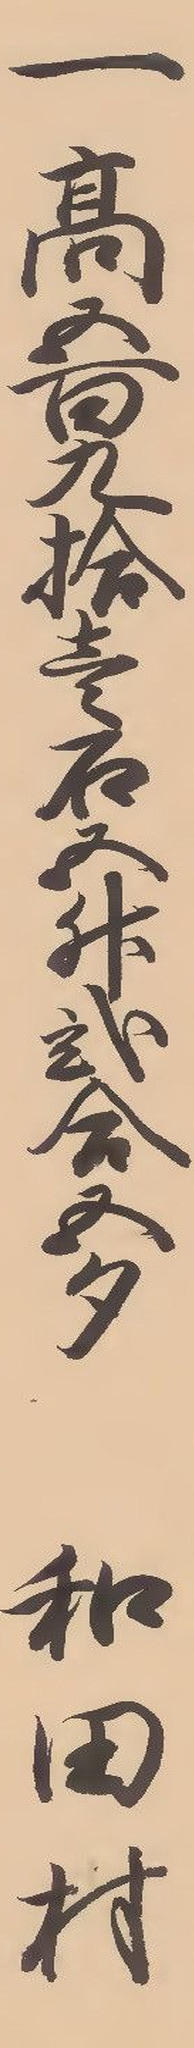一高五百九拾壱石五升弐合五勺和田村
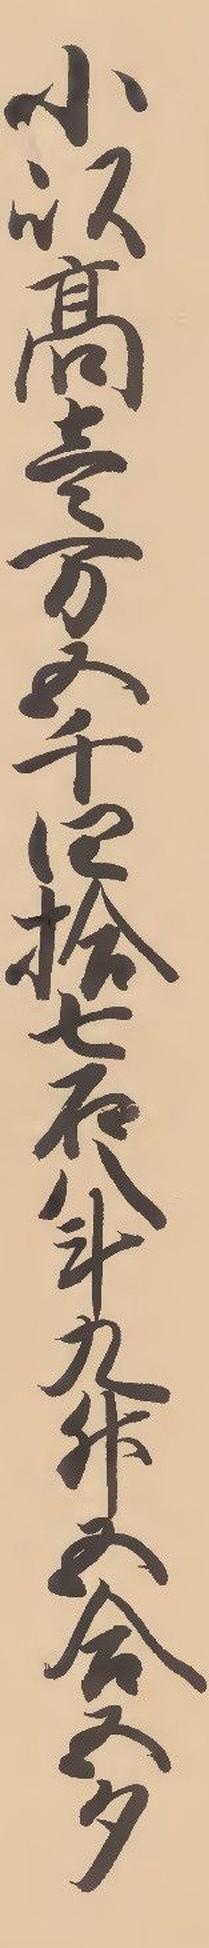小以高壱万五千四拾七石八斗九升五合五勺

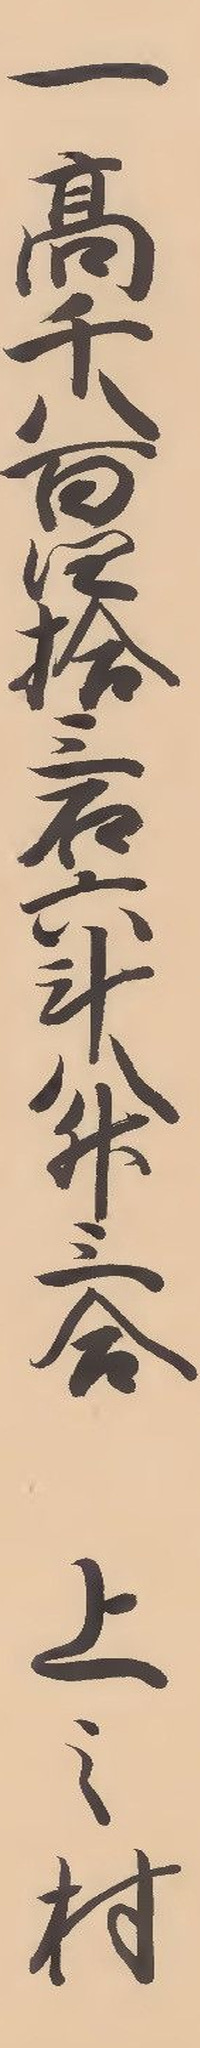一高千八百四拾三石六斗八升三合上之村
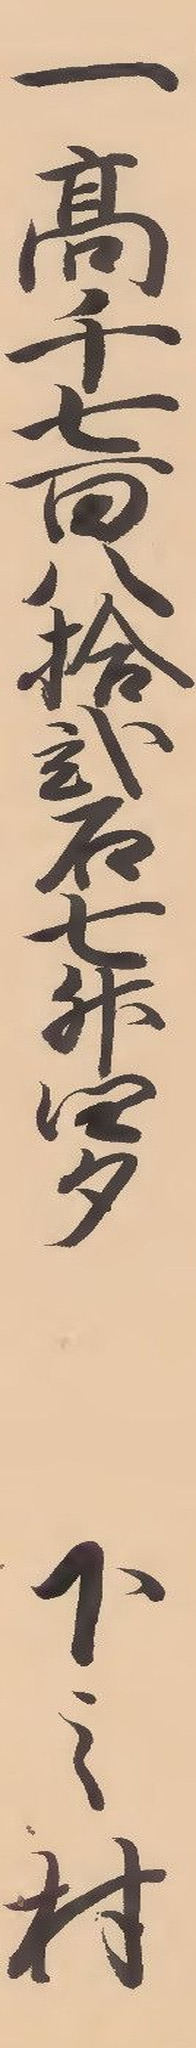一高千七百八拾弐石七升四勺下之村
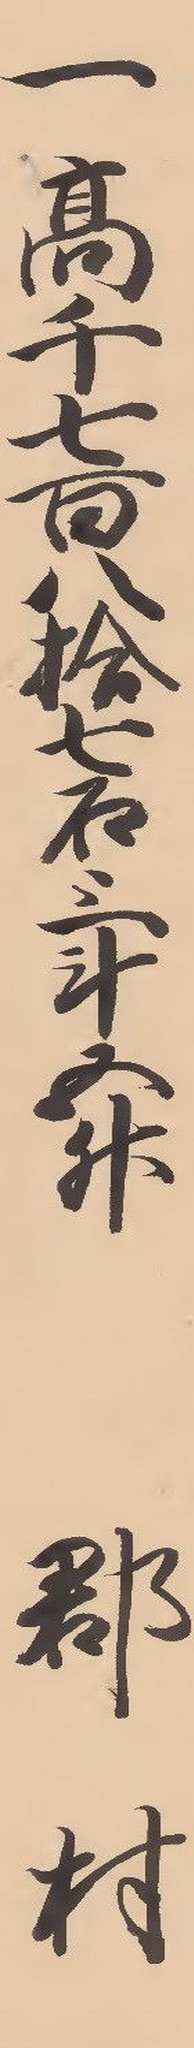一高千七百八拾七石三斗五升郡村
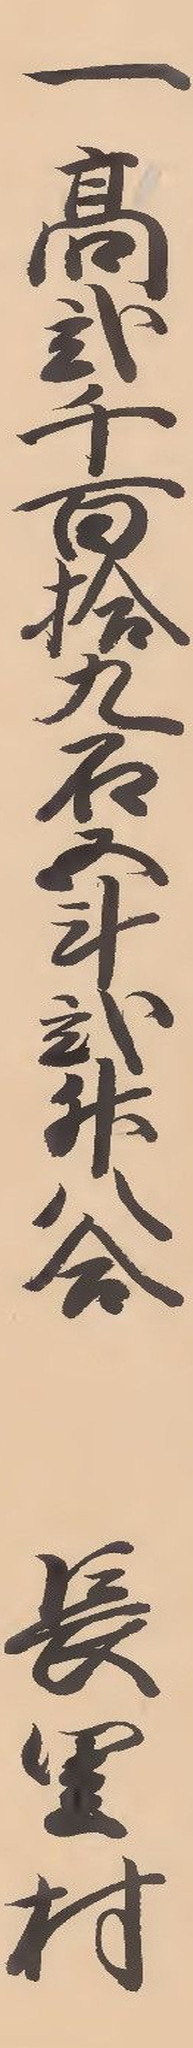一高弐千百拾九石五斗弐升八合長里村
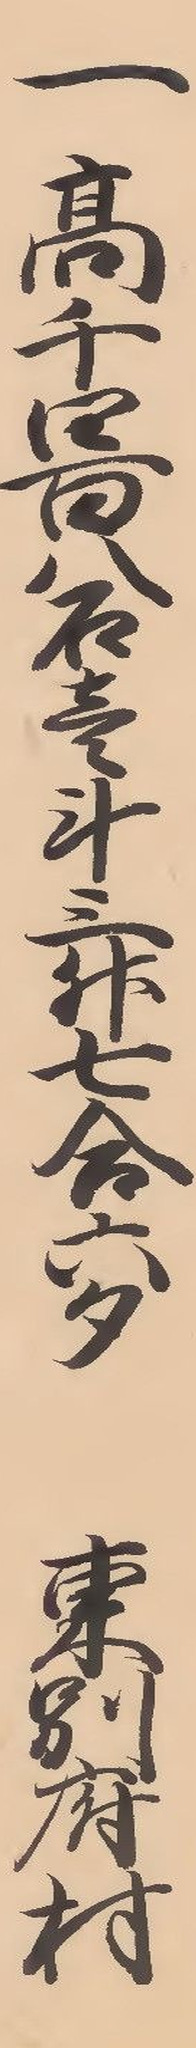一高千四百八石壱斗三升七合六勺東別府村
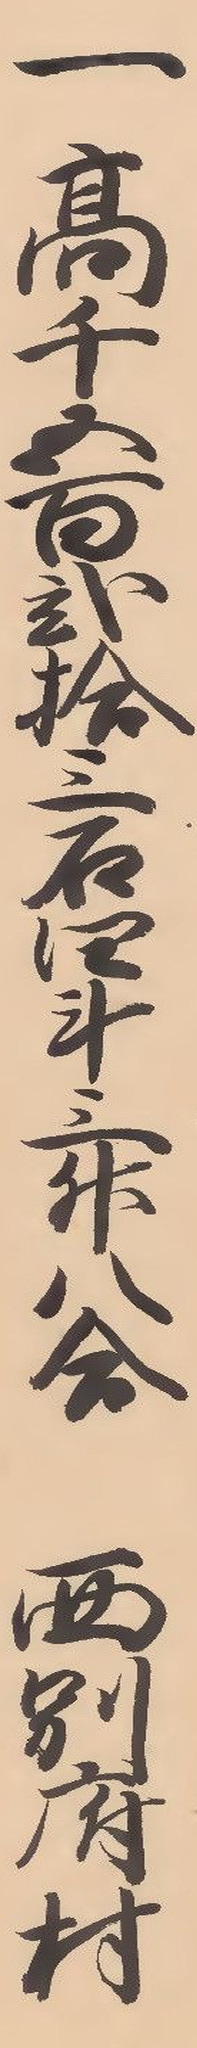一高千五百弐拾三石四斗三升八合西別府村
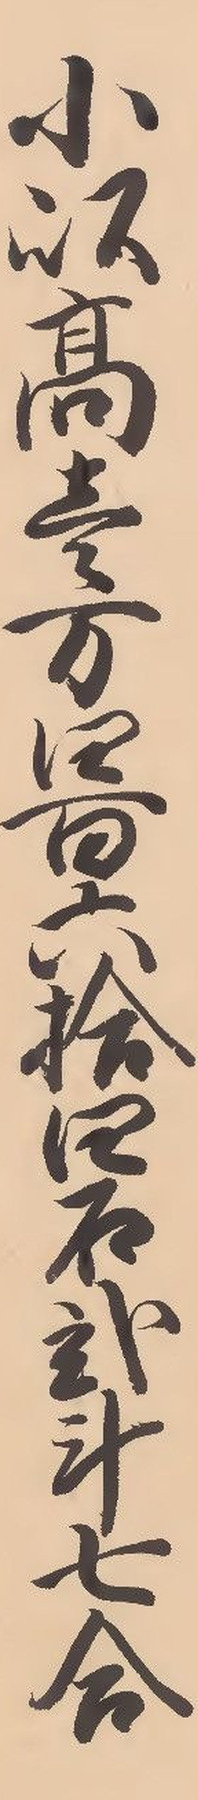小以高壱万四百六拾四石弐斗七合

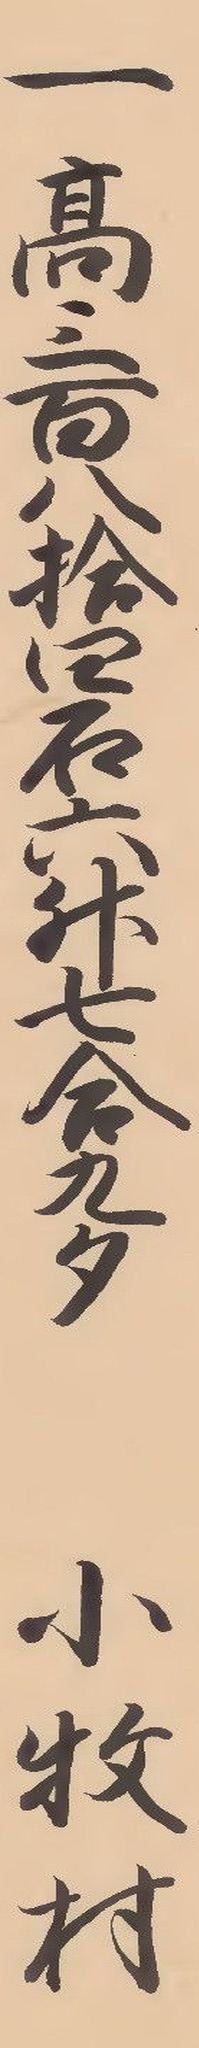一高三百八拾四石六升七合九勺小牧村
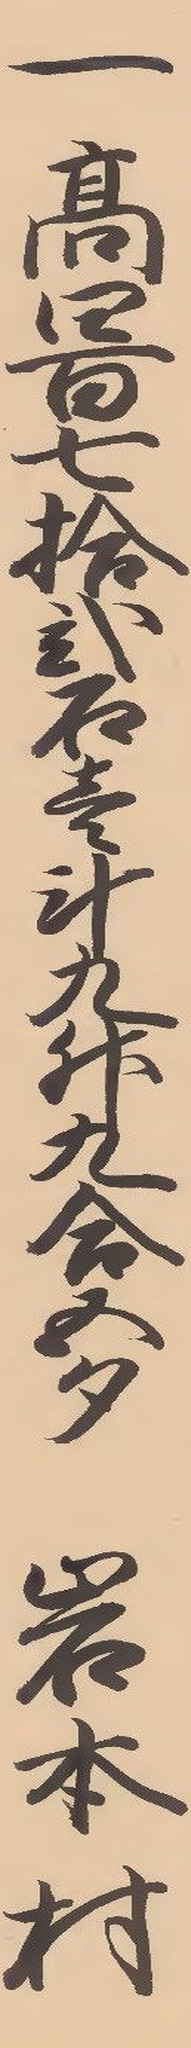一高四百七拾弐石壱斗九升九合五勺岩本村
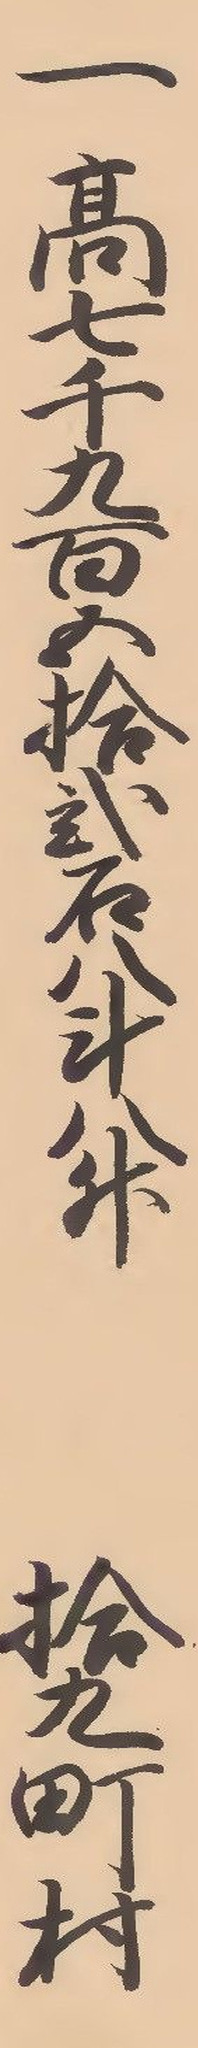一高七千九百五拾弐石八斗八升拾九町村

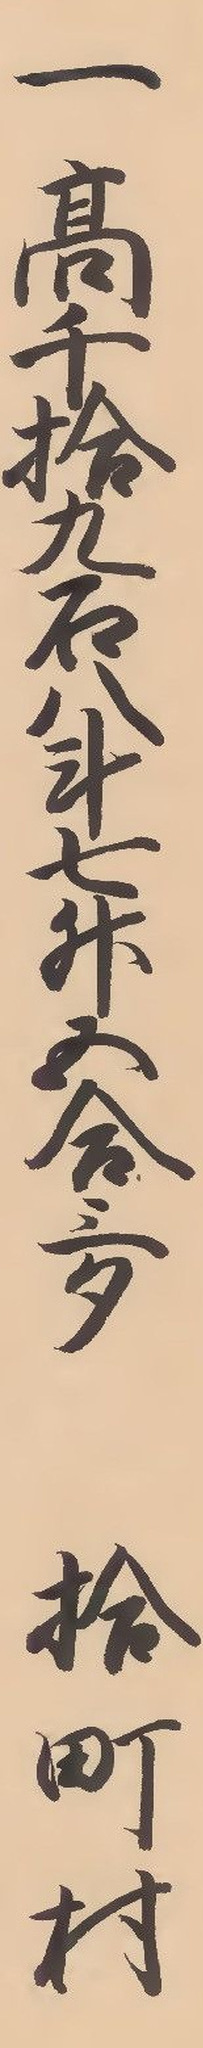一高千拾九石八斗七升五合三勺拾町村
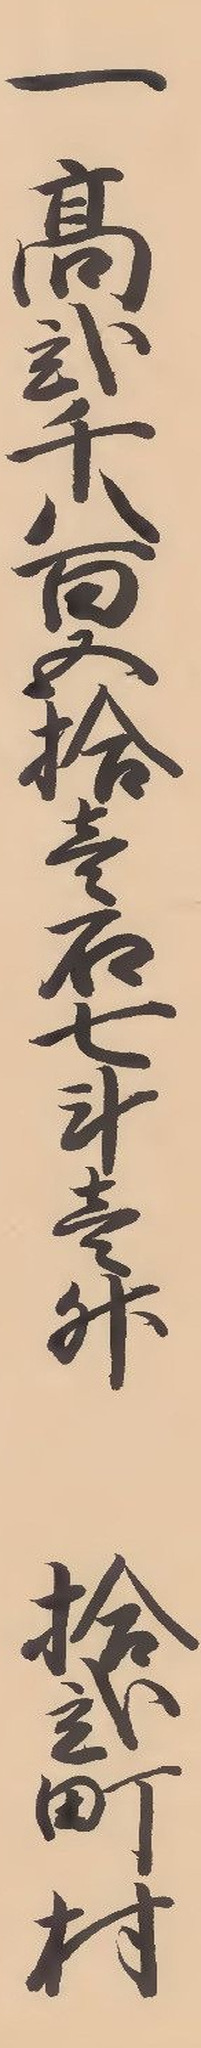一高弐千八百五拾壱石七斗壱升拾弐町村
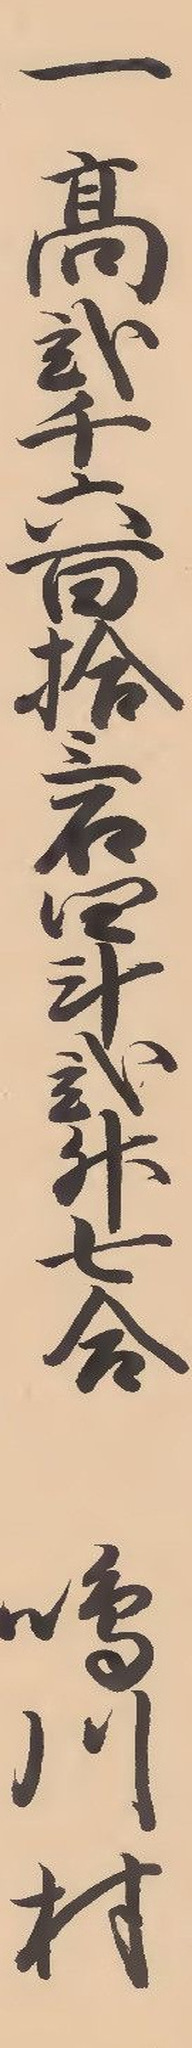一高弐千六百拾三石四斗弐升七合鳴川村
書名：薩摩国郷帳
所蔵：国立公文書館 National Archives of Japan
